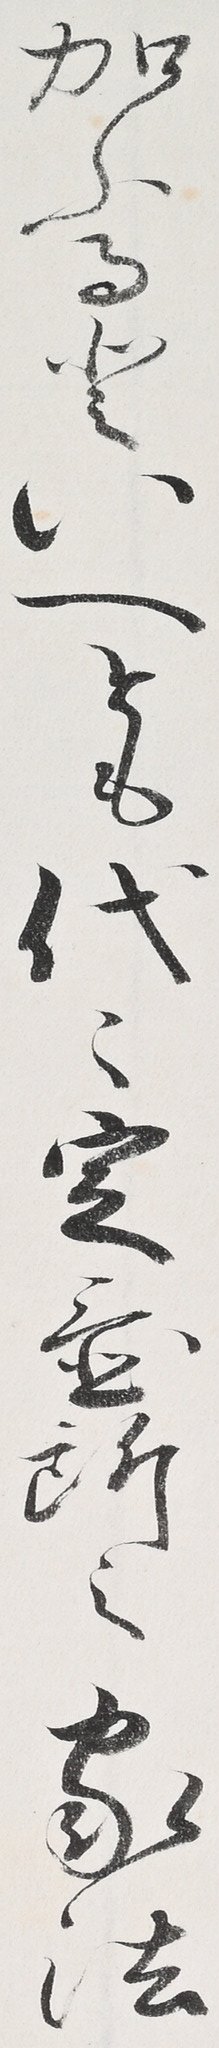加ふるといへとも代々定置所之家法
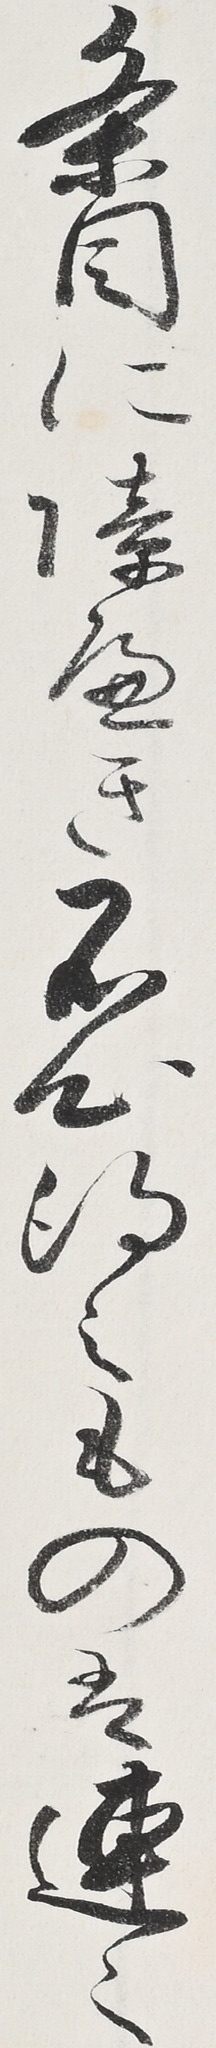条目に障へき不心得之ものは連々
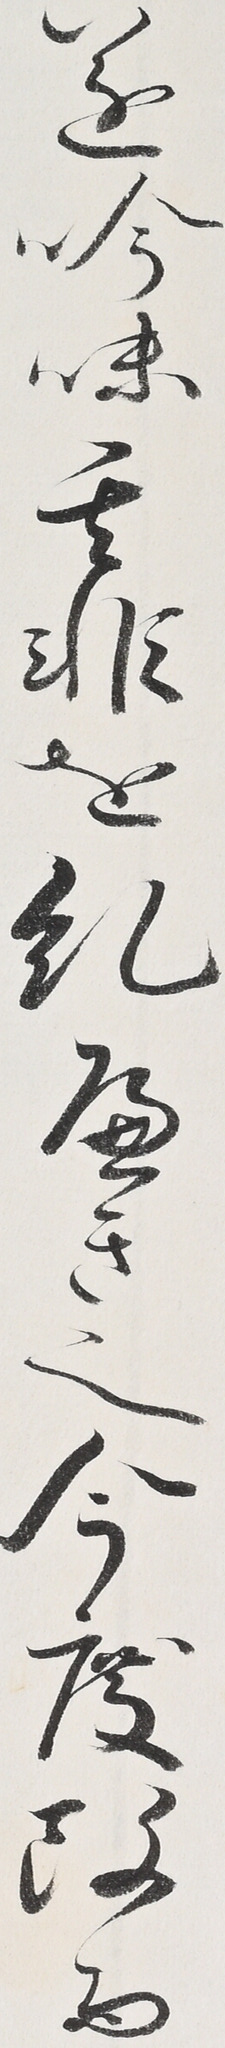遂吟味其非を糺へき也今度改て
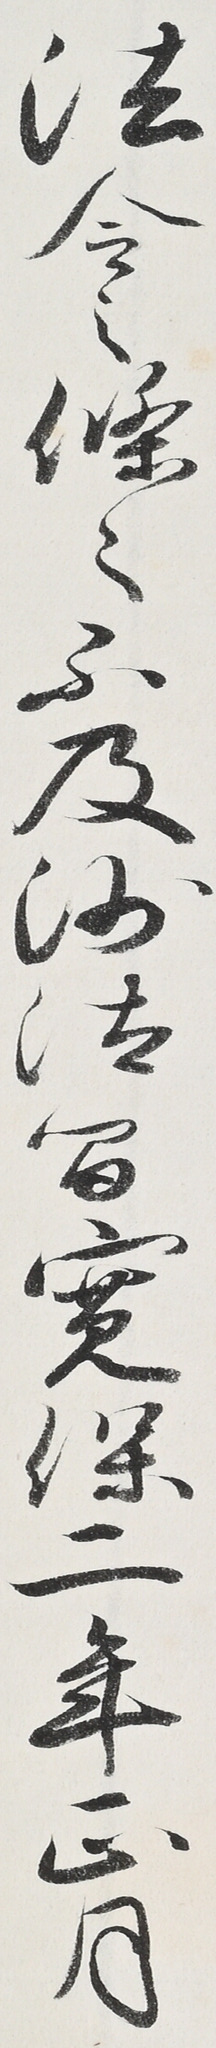法令之條々不及沙汰間寛保二年正月
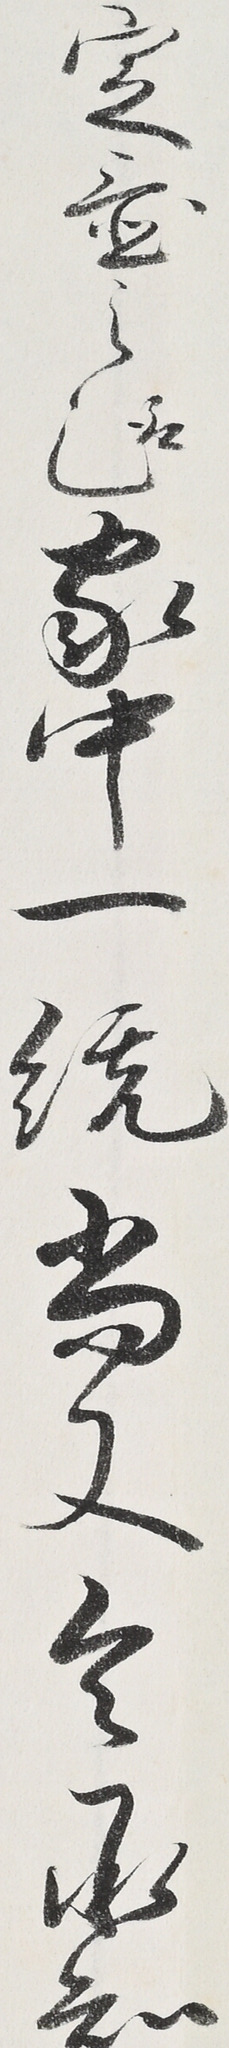定置之趣家中一統尚又令承知
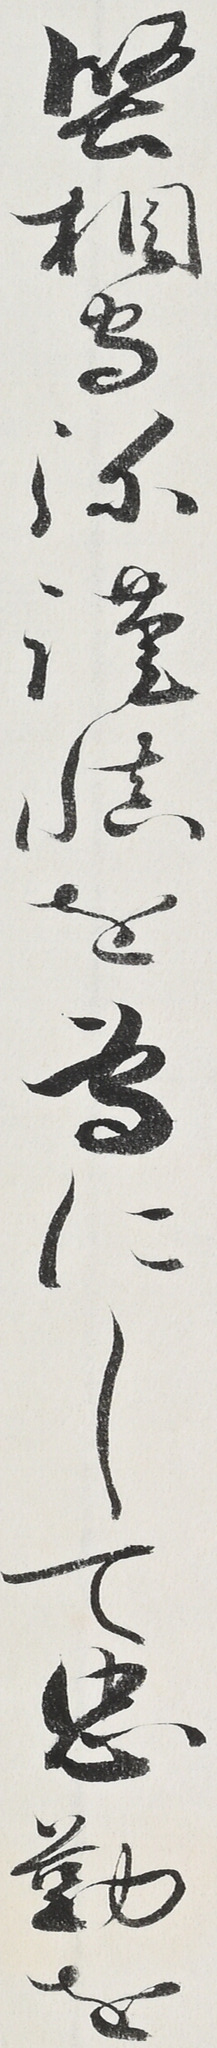堅相守弥謹慎を専にして忠勤を
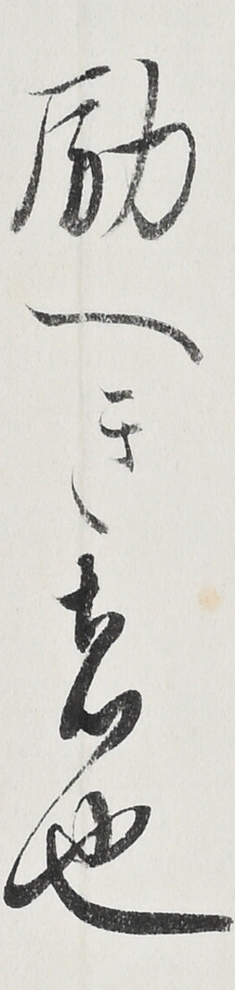励へき者也
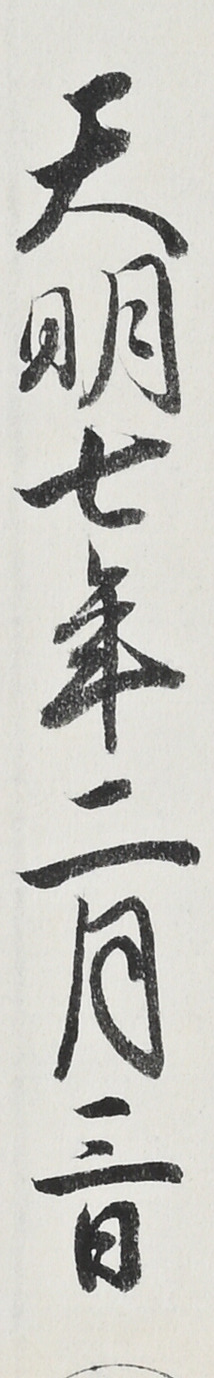天明七年二月三日
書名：御添書
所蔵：伊那市立高遠町図書館・合同会社AMANE
